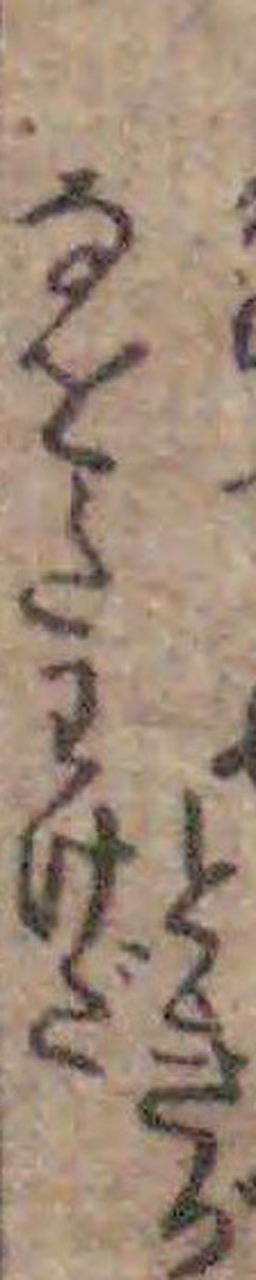なをたわけだ

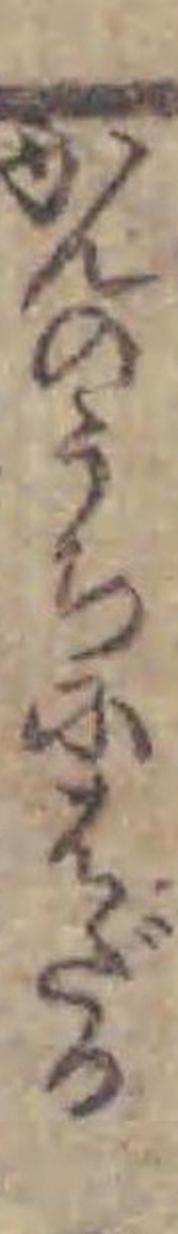かんのうちにはだか
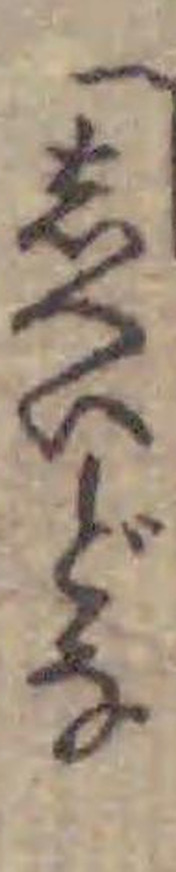〽しへいどな
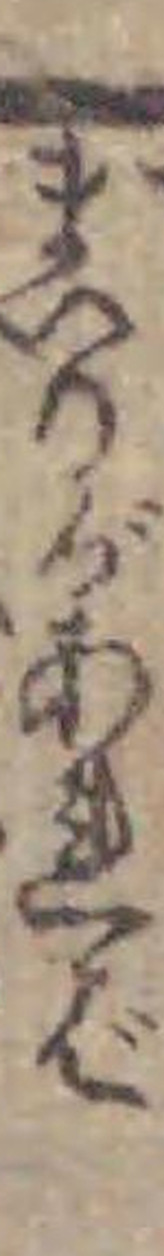まいりがあれば
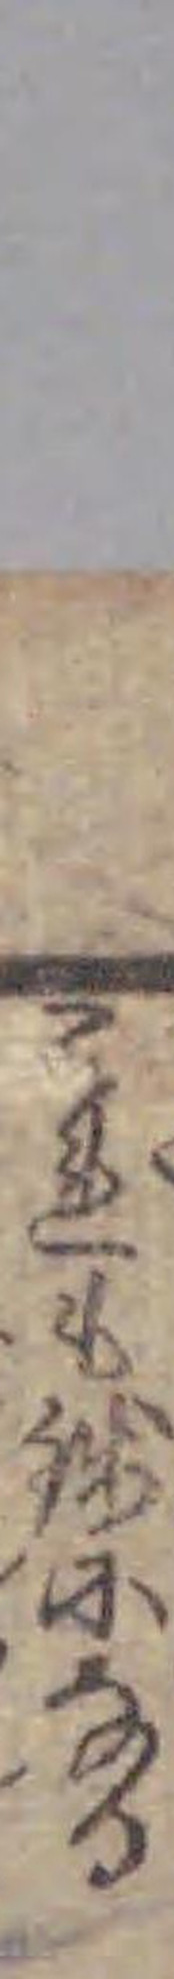これも銭にになる
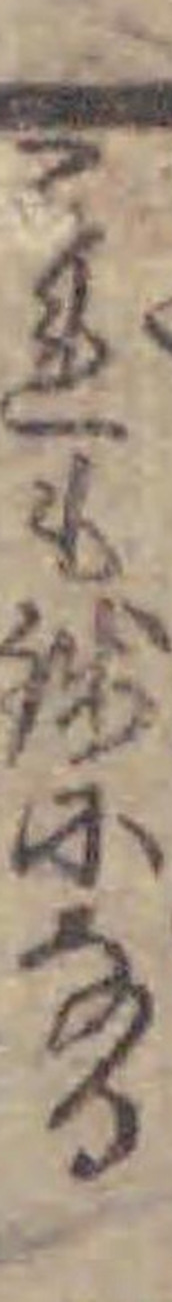これも銭にになる
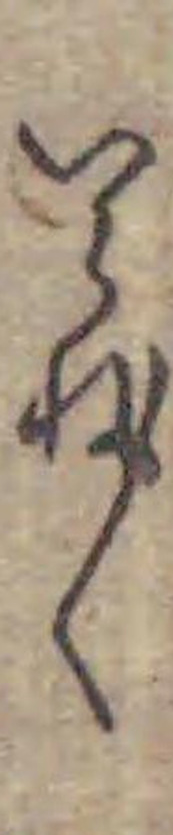いらね〳〵
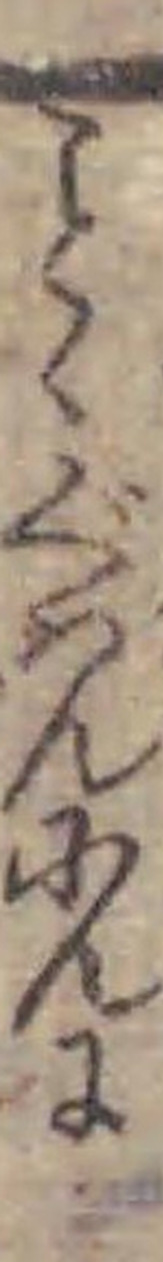ことゝぐはんにんに
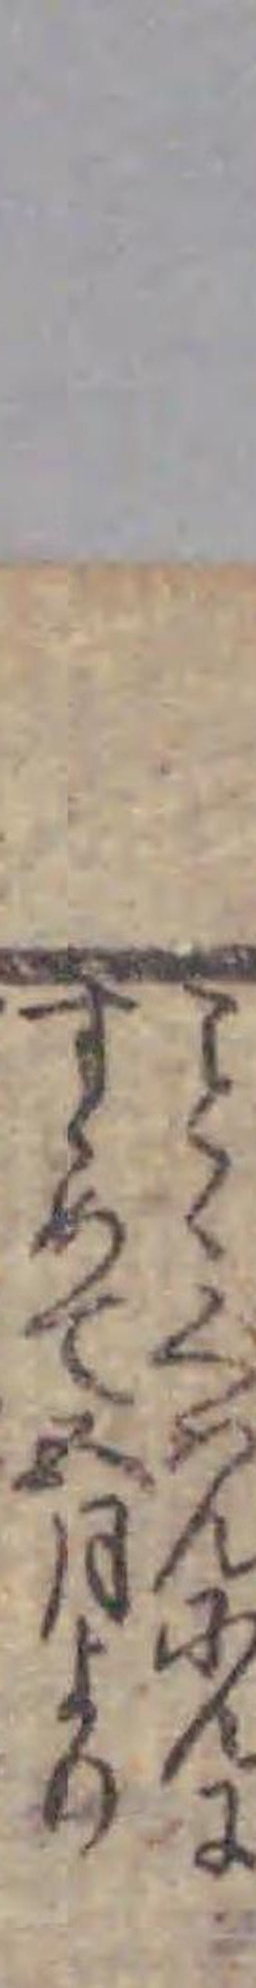すゝめて五月より
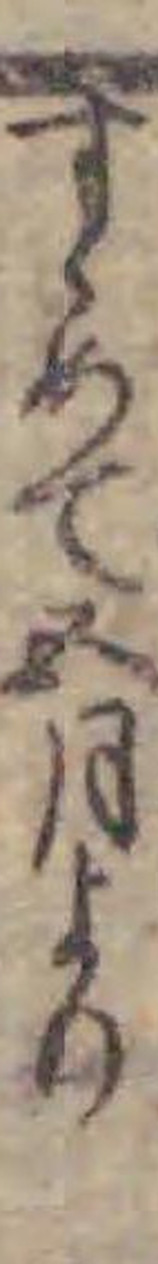すゝめて五月より
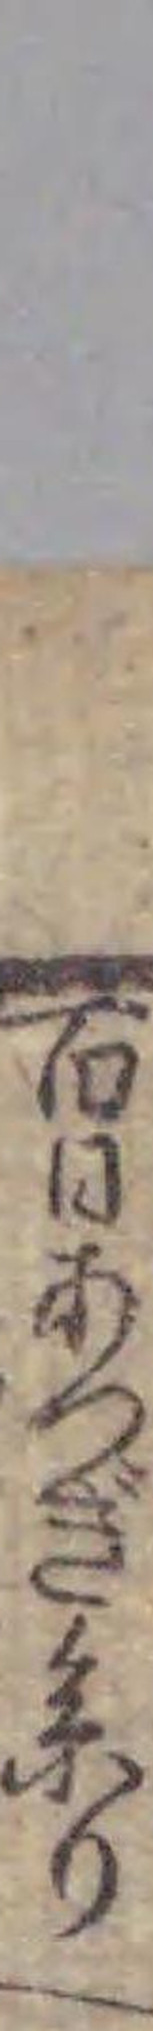百日あつぎ参り
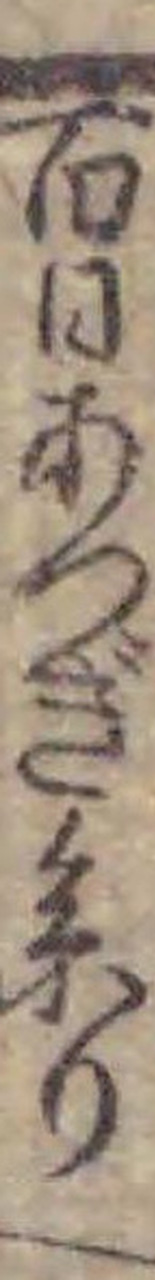百日あつぎ参り
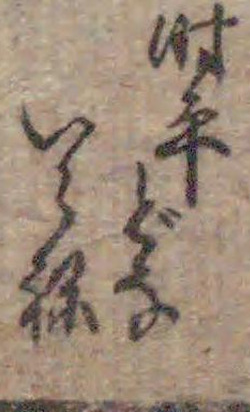いらね
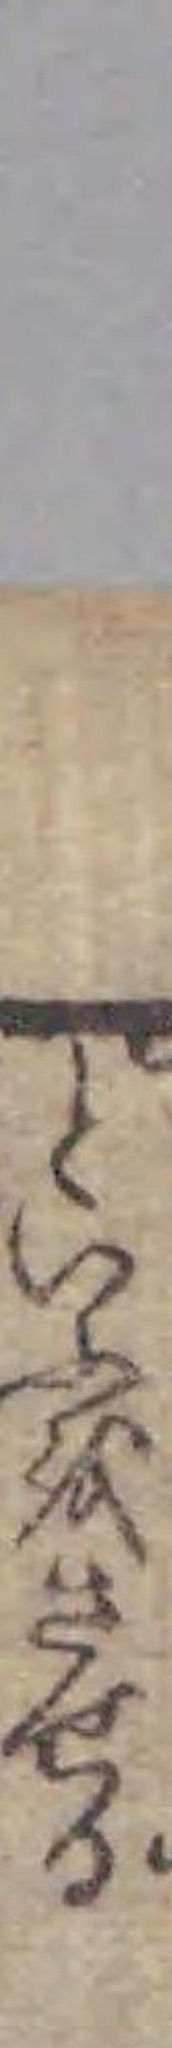といふをさせる
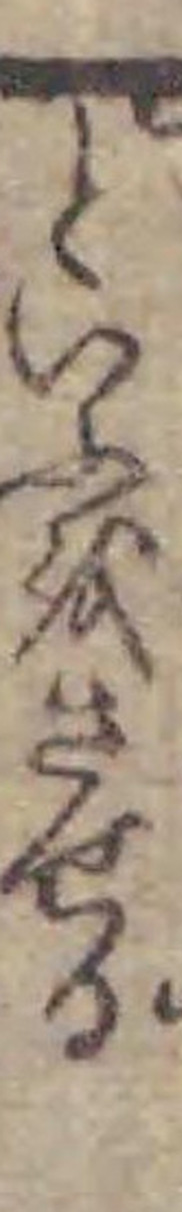といふをさせる
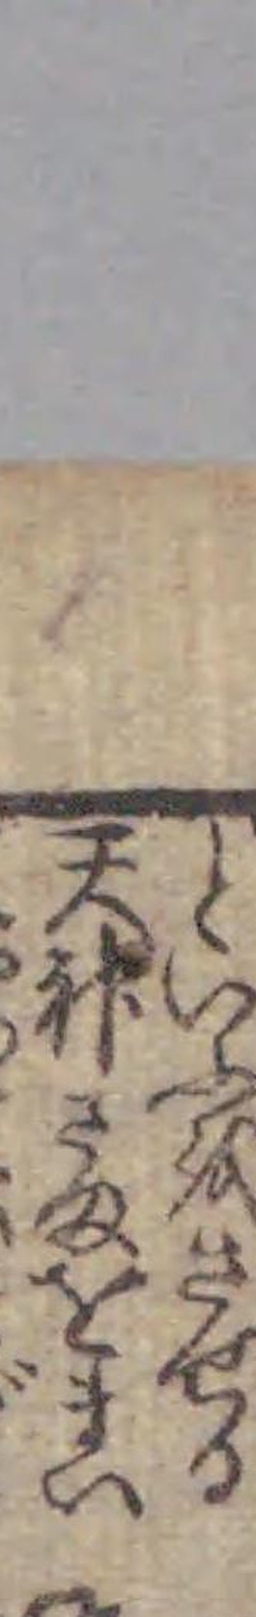天神さまをまい
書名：本樹真猿浮気噺 : 3巻
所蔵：国立国会図書館 National Diet Library, JAPAN
